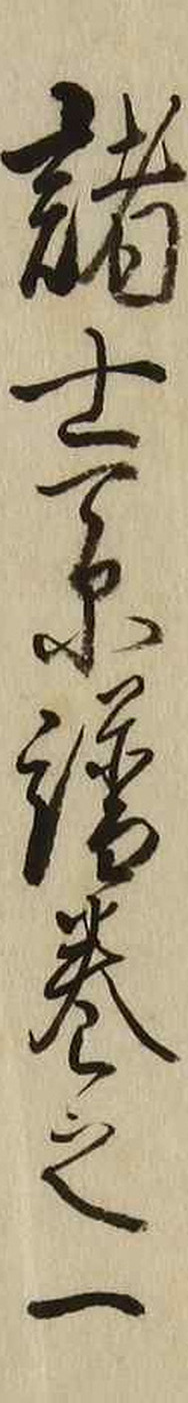諸士系譜巻之一
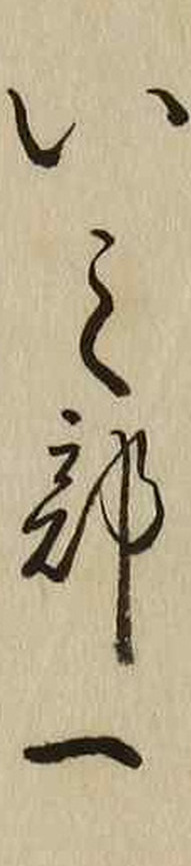い之部一
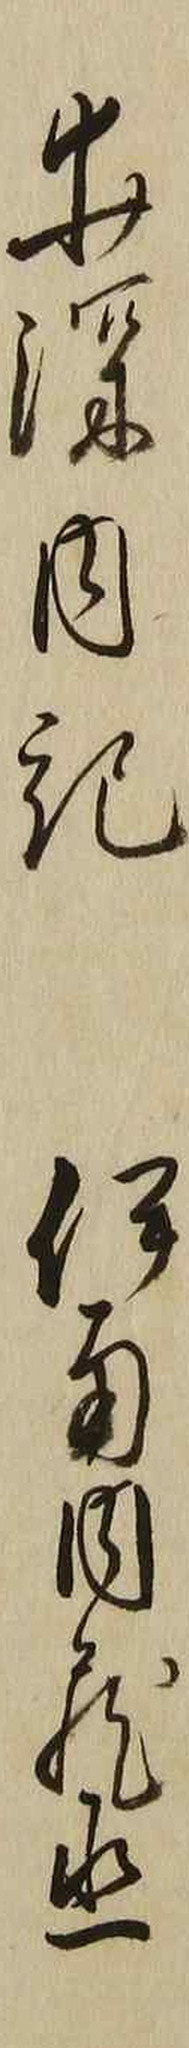井深内記伊南内蔵丞
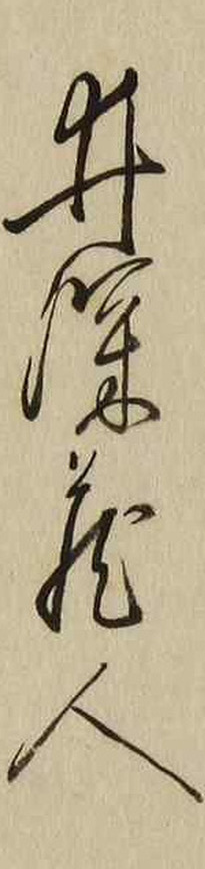井深蔵人

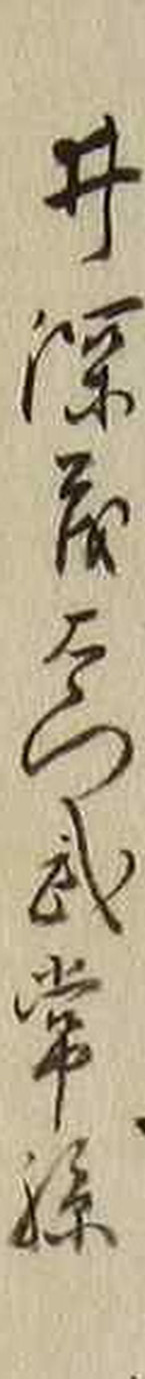井深茂右衛門武常孫
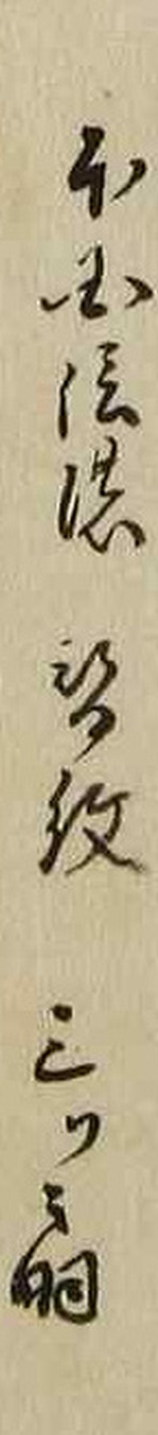本国信濃替紋三ツ扇
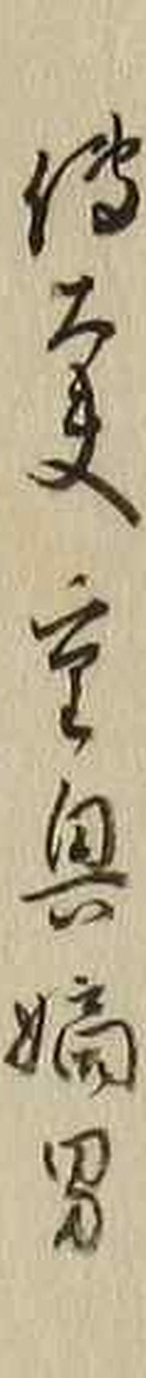伝大夫重興嫡男
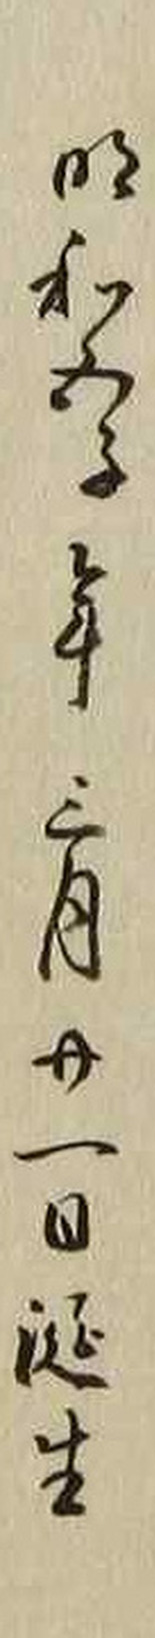明和五子年三月廿一日誕生
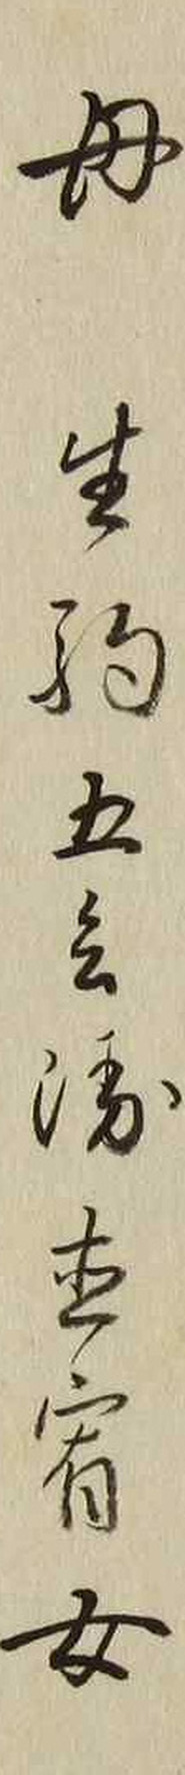母生駒五兵衛直宥女
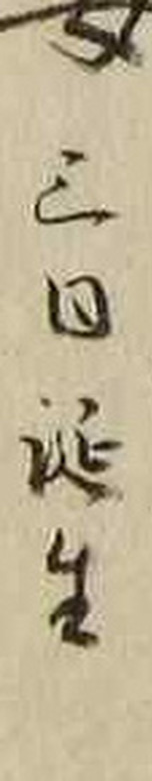三日誕生
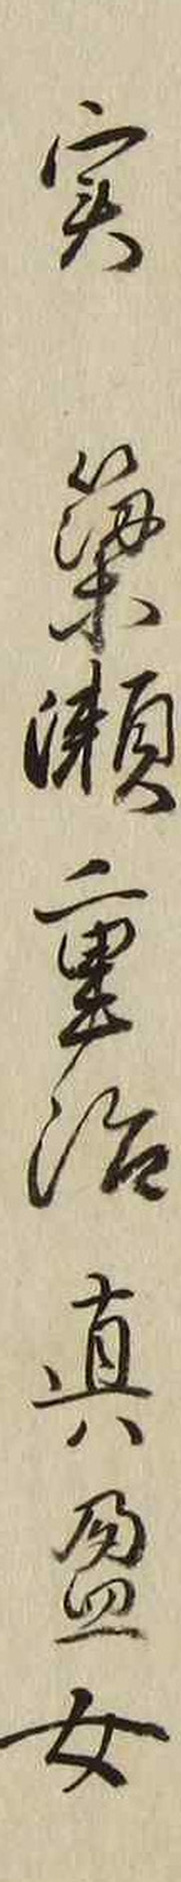実簗瀬重治直盈女

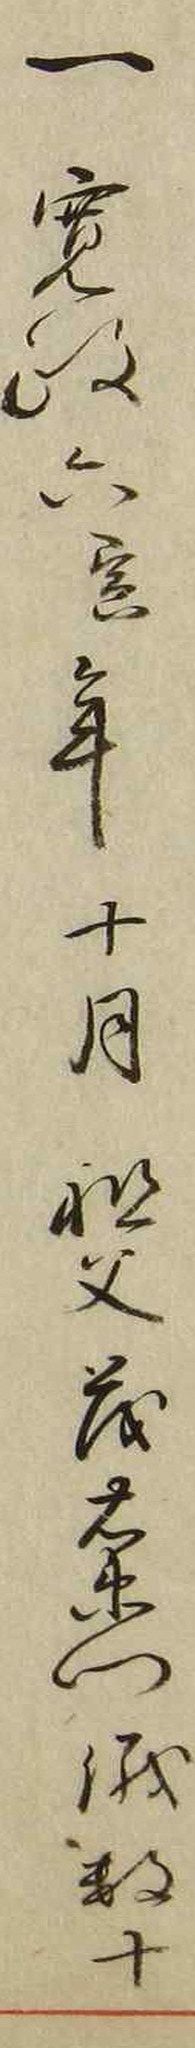一寛政六寅年十月祖父茂右門儀数十
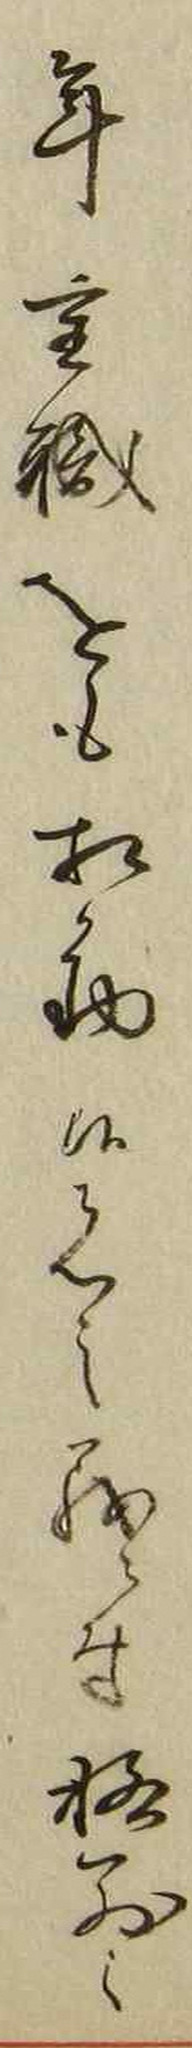年重職をも相勤候者之義に付格別之
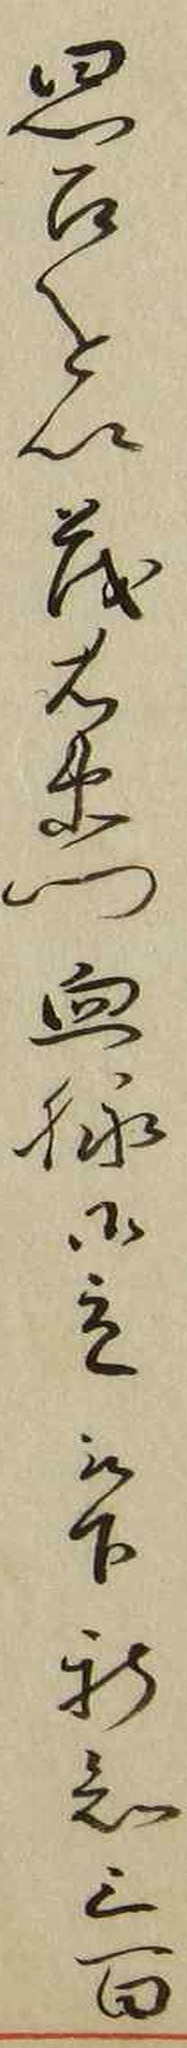思召を以茂右衛門血脉御立被下新知三百
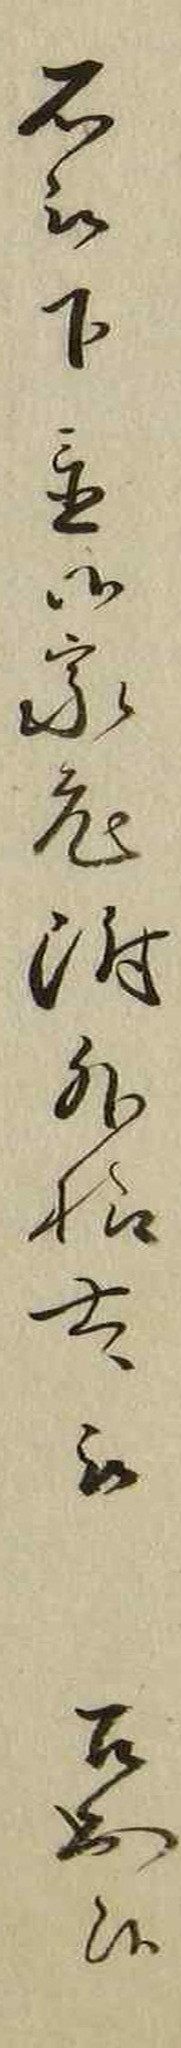石被下置御家老附外様士へ被召出候
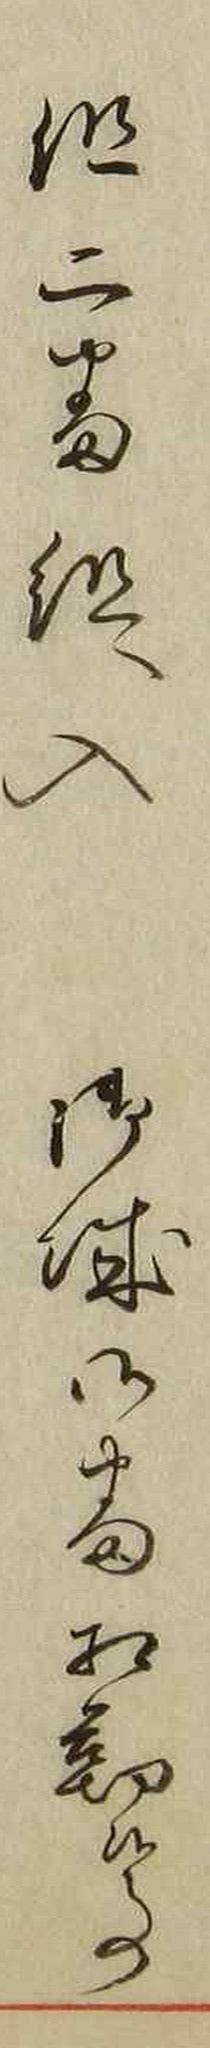但二番組へ入御城御番相勤候事
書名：諸士系譜　巻之1　い之部1
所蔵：会津若松市立会津図書館
